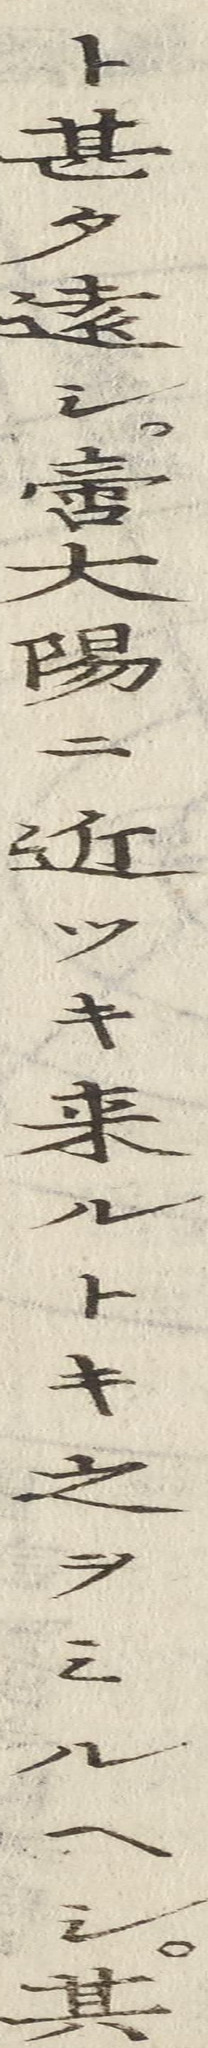ト甚タ遠シ。啻大陽ニ近ツキ来ルトキ之ヲミルヘシ。其
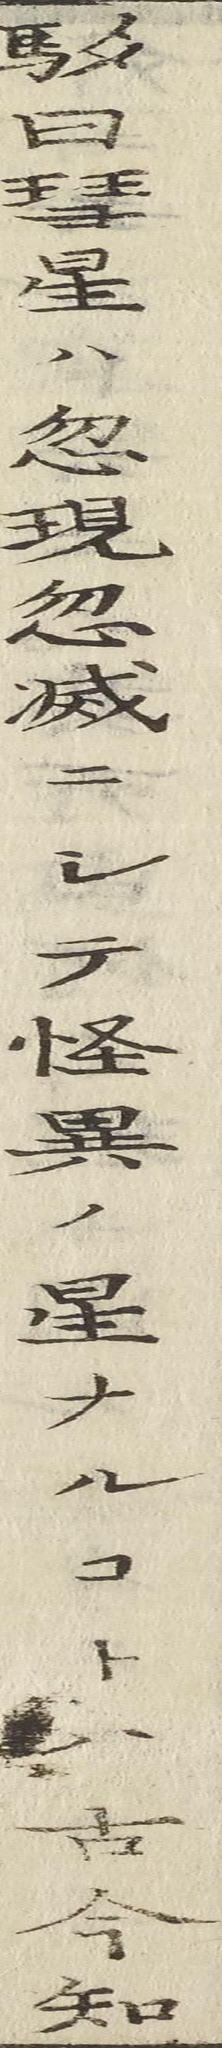駁曰彗星ハ忽現忽滅ニシテ怪異ナルコトハ古今知
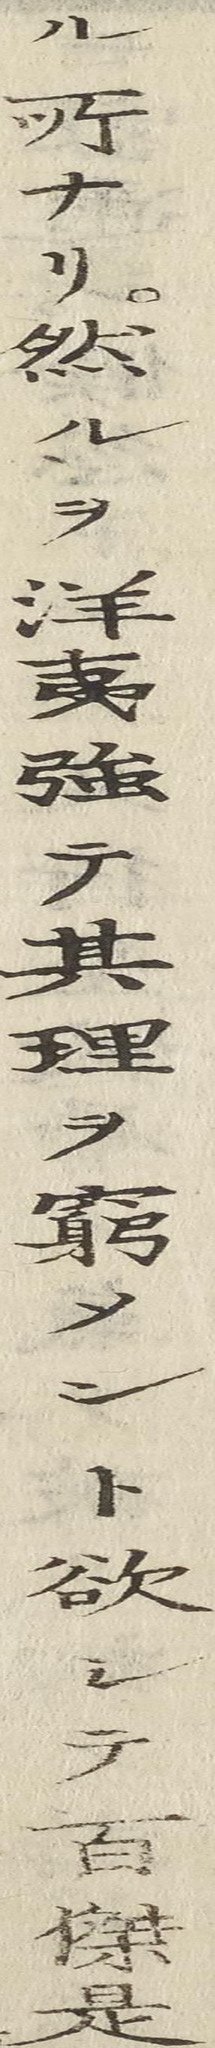ル所ナリ。然ルヲ洋夷強テ其理ヲ窮メント欲シテ百傑是
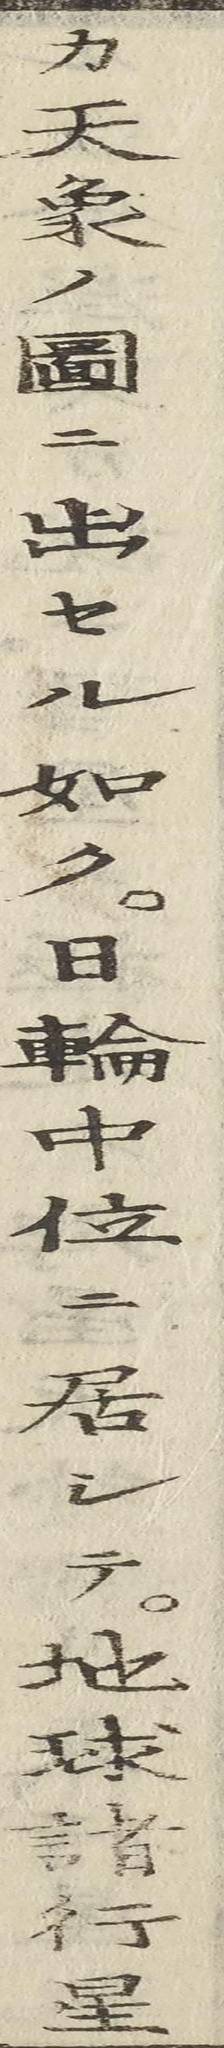カ天象ノ図ニ出セル如ク。日輪中位ニ居シテ。地球諸行星
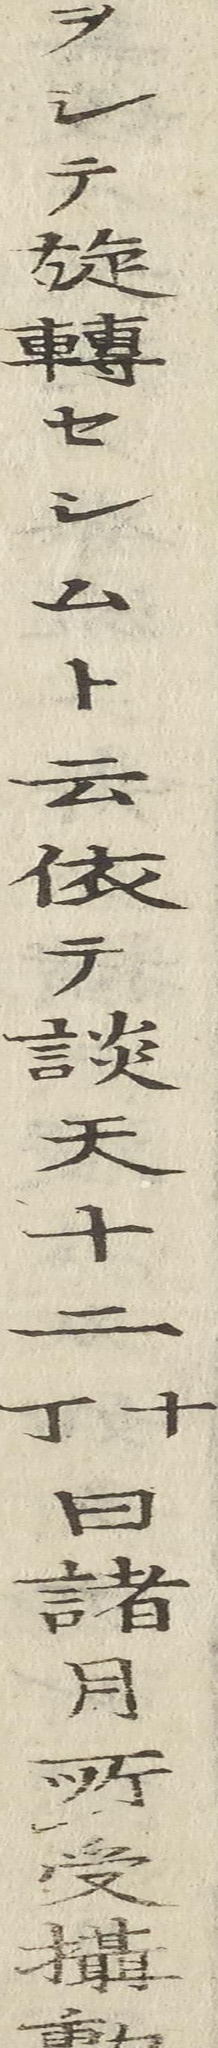ヲシテ旋転セシムト云依テ談天十ニ十丁曰諸月所受摂動
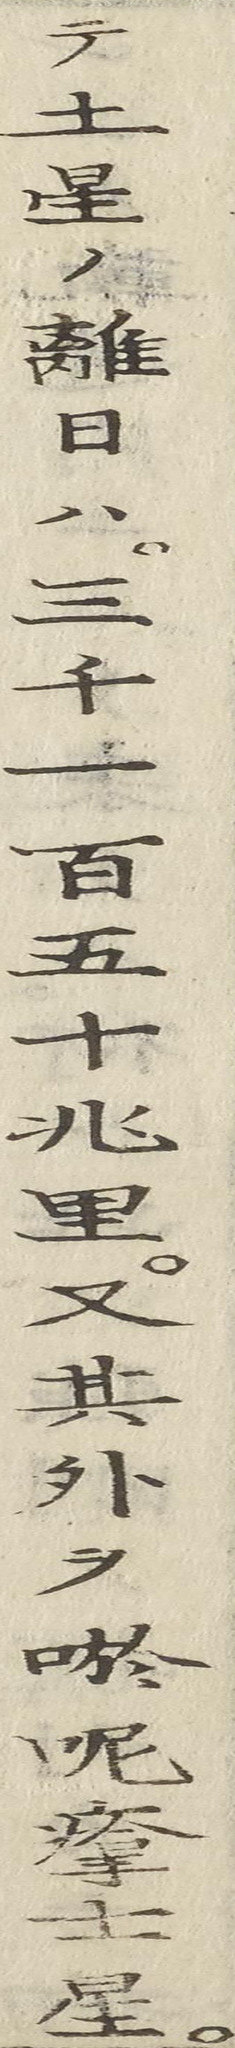テ土星ノ離日ハ。三千一百五十兆里。又其外ヲ唹呢拿？土星。
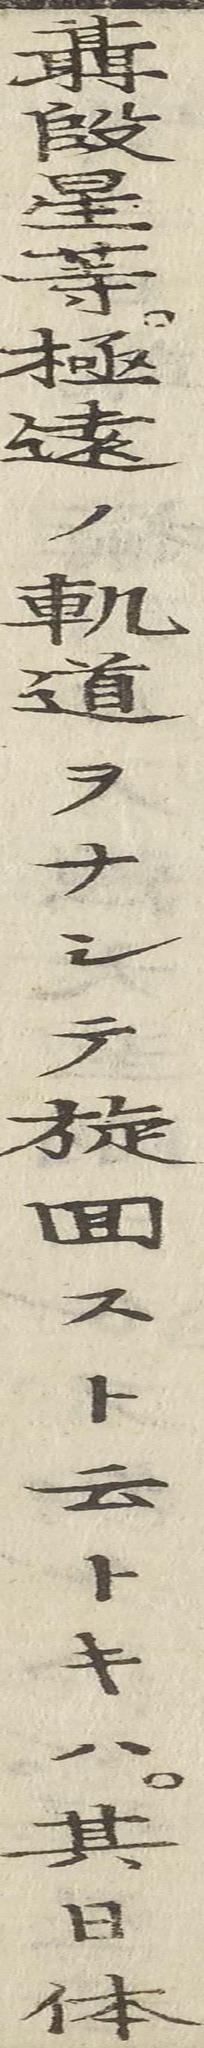聶段星等。極遠ノ軌道ヲナシテ旋回スト云トキハ。其日体
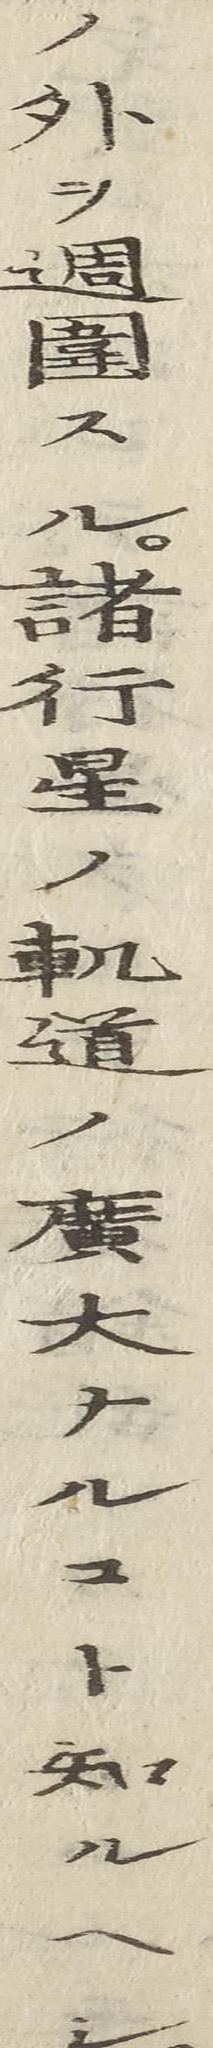ノ外ヲ週囲スル。諸行星ノ軌道ノ広大ナルコト知ルヘシ。
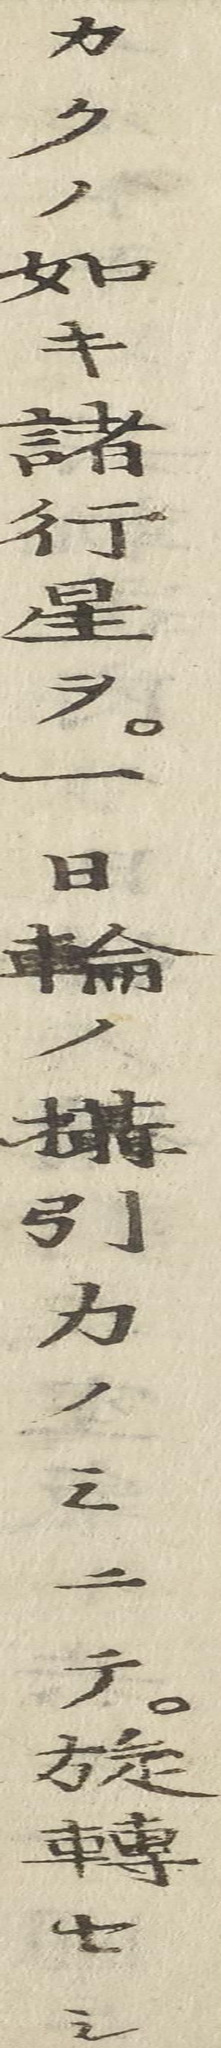カクノ如キ諸行星ヲ。一日輪ノ摂引力ノミニテ。旋転セシ

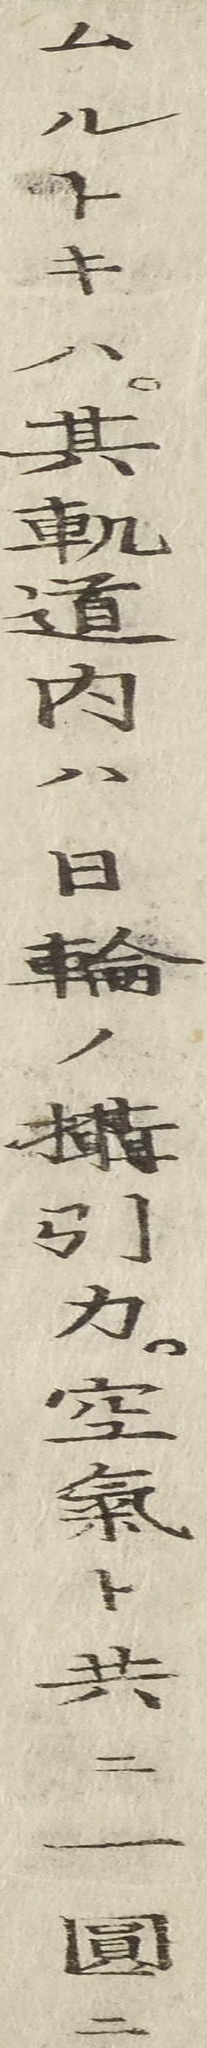ムルトキハ。其軌道内ハ日輪ノ摂引力。空気ト共ニ一円ニ
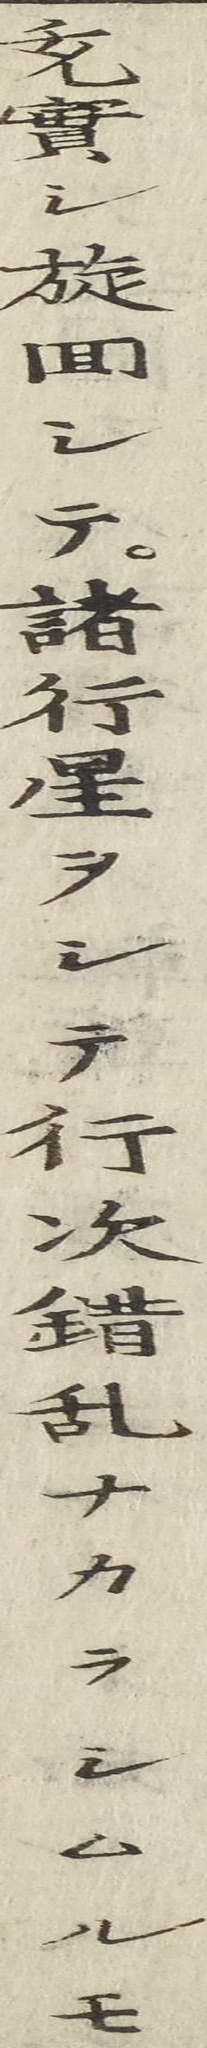允実シ旋回シテ。諸行星ヲシテ行次錯乱ナカラシムルモ
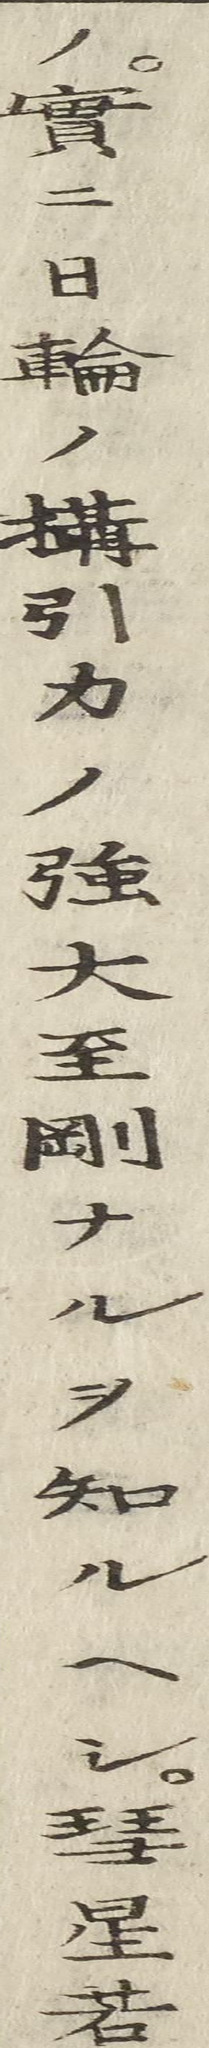ノ。実ニ日輪ノ摂引力ノ強大至剛ナルヲ知ルヘシ。彗星若
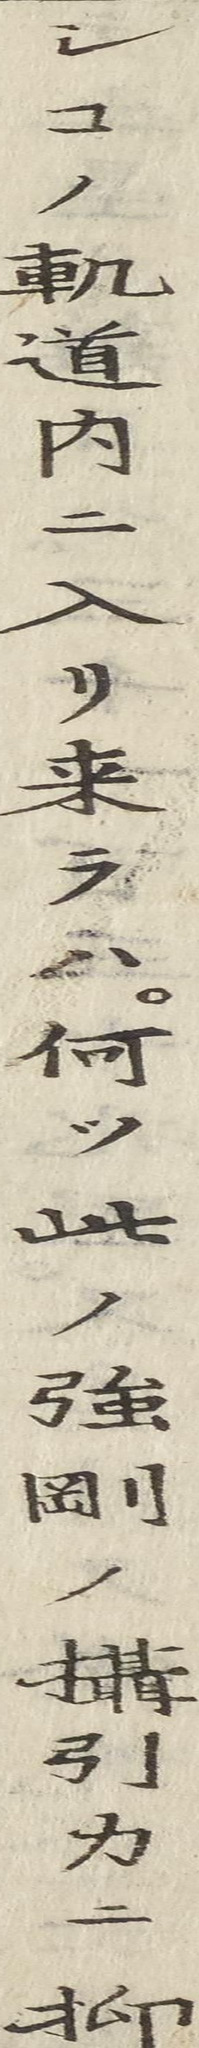シコノ軌道内ニ入リ来ラハ。何ソ此ノ強剛ノ摂引力ニ抑
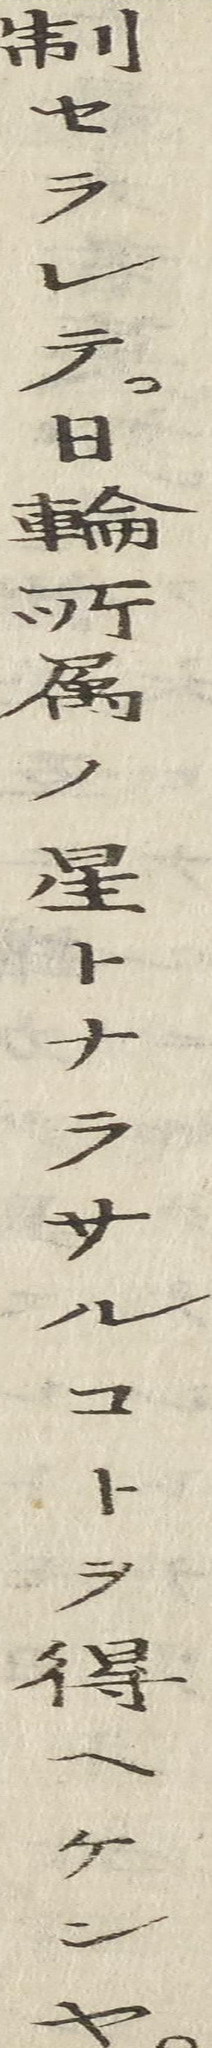制セラレテ。日輪所属ノ星トナラサルコトヲ得ヘケンヤ。
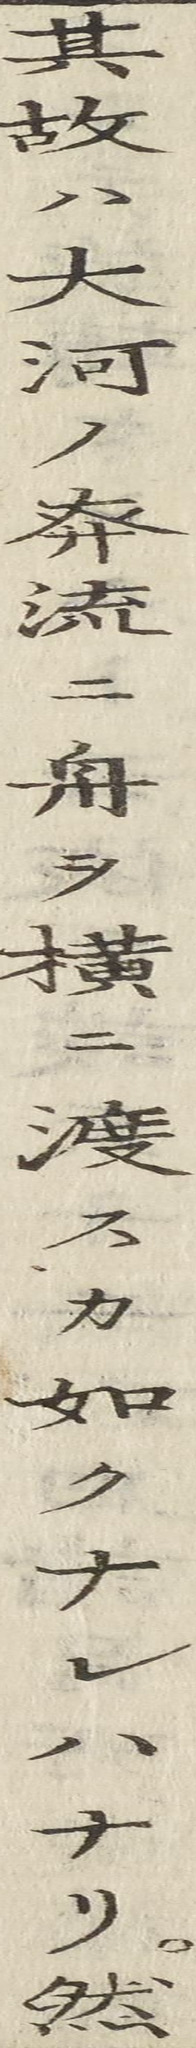其故ハ大河ノ奔流ニ舟ヲ横ニ渡スカ如クナレハナリ。然
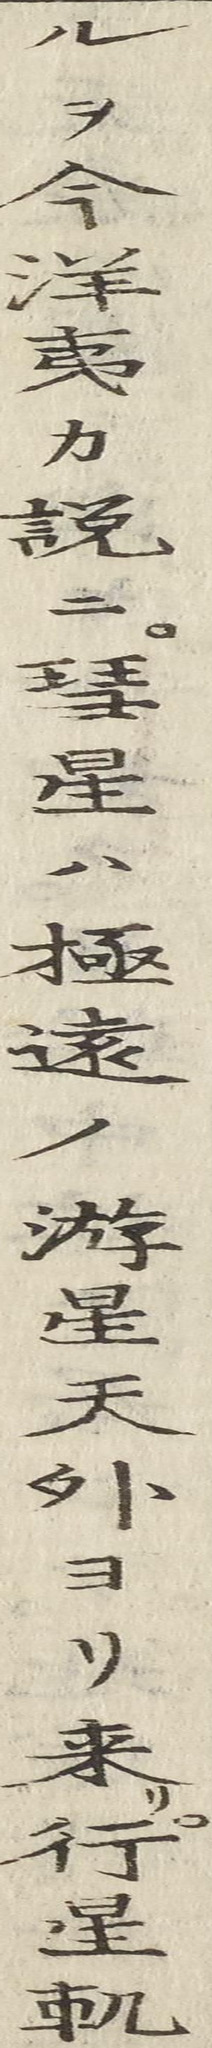ルヲ今洋夷カ説ニ。彗星ハ極遠ノ游星天外ヨリ来。行星軌
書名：護法新論　二編　下
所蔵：東京大学地震研究所図書室 Earthquake Research Institute Library, The University of Tokyo, JAPAN
